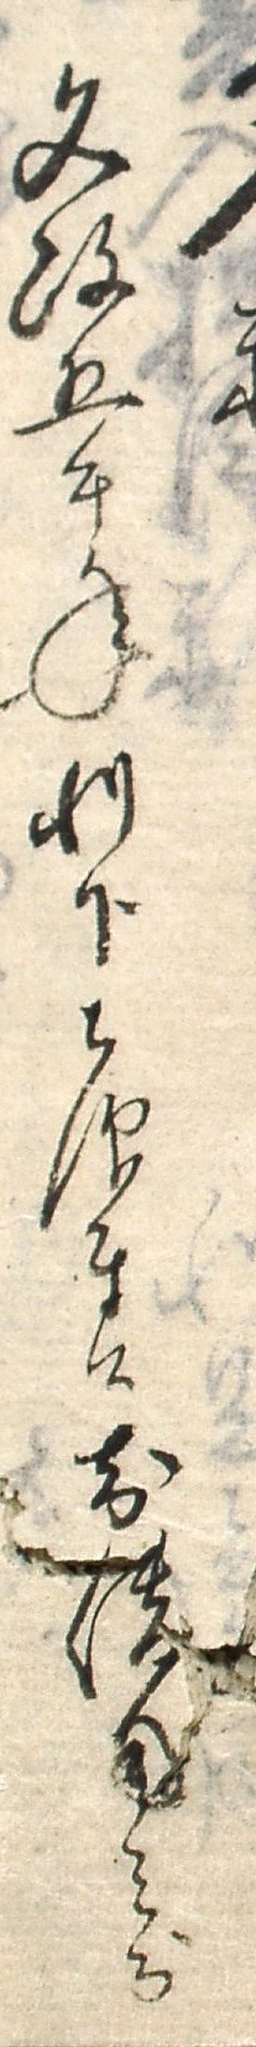文政五午年利下被仰付候前借用之分
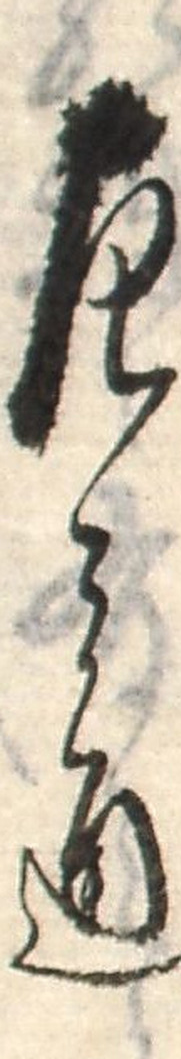左之通
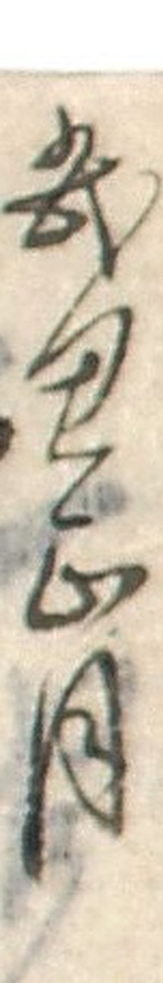当丑正月
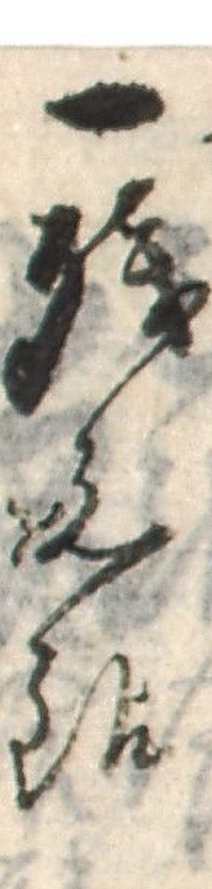一残元銀
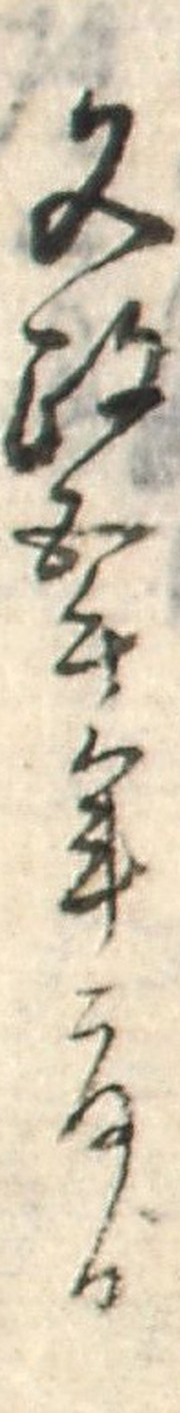文政五午年夏ゟ

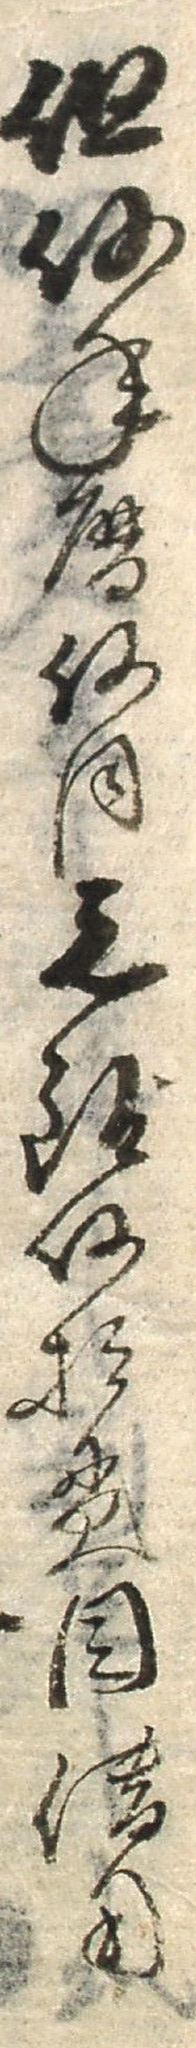但何年暦何月元銀何拾貫目借用
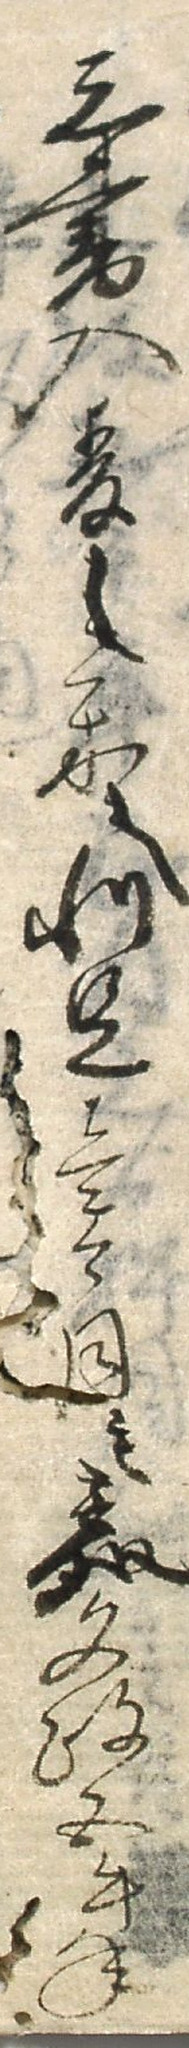元書入麦―米―利足壱ヶ月には処文政五午年
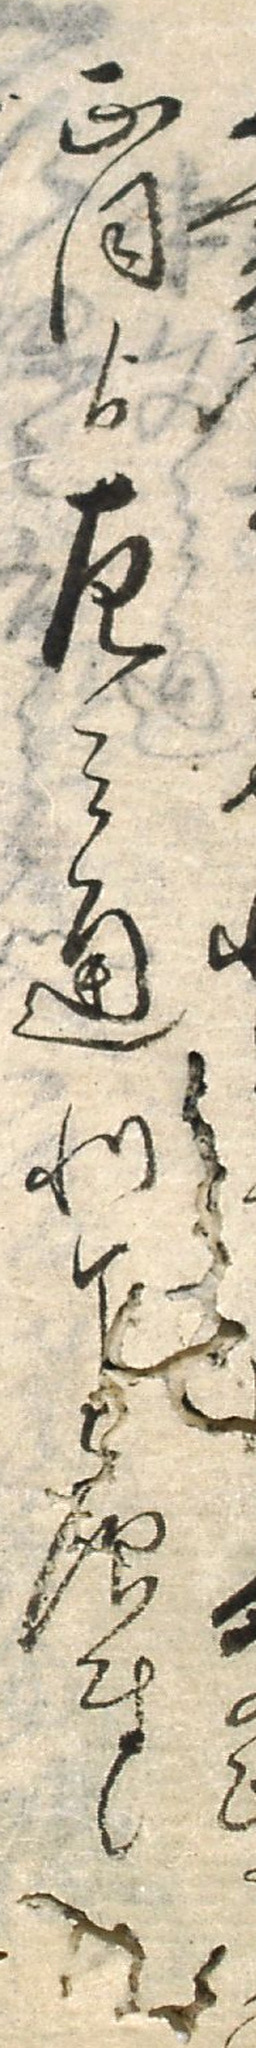正月ゟ左之通利下被仰付候
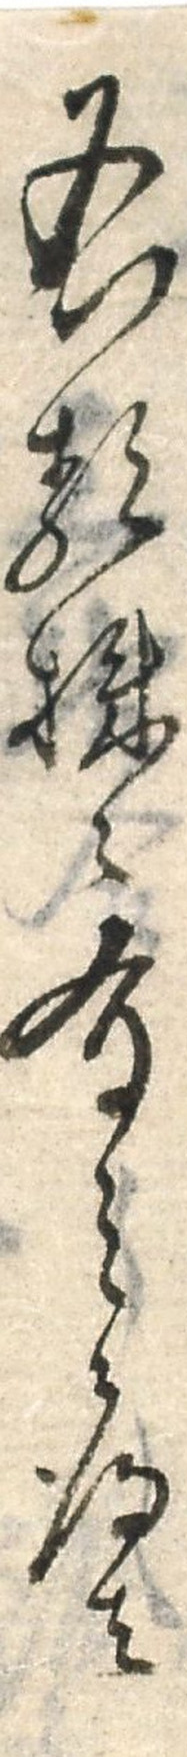右類株々有之候得は
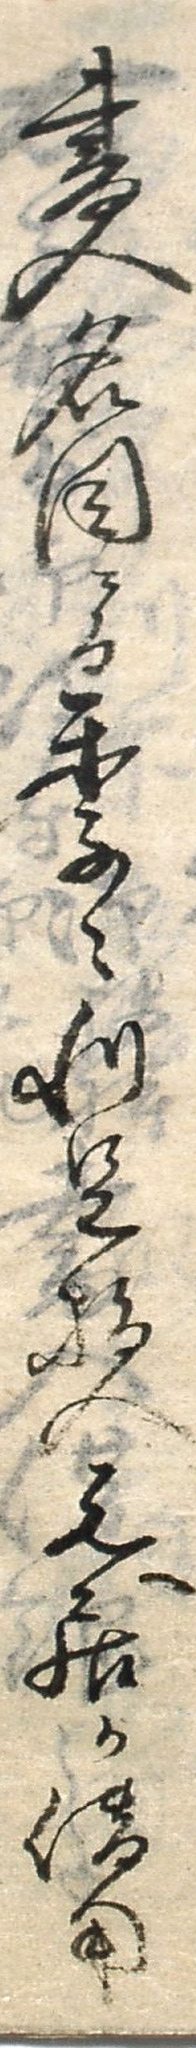書入名目に而季々利足指入元居り借用
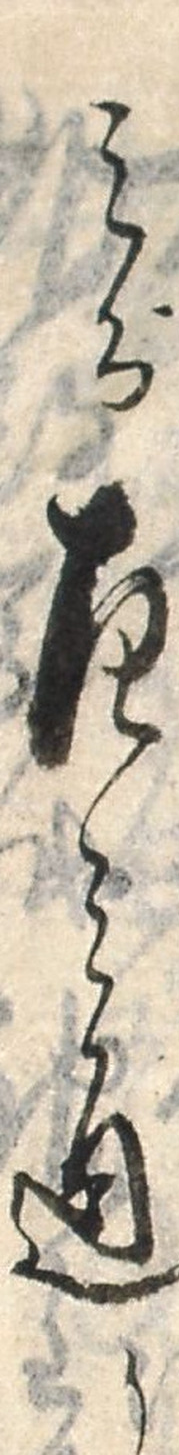之分左之通り
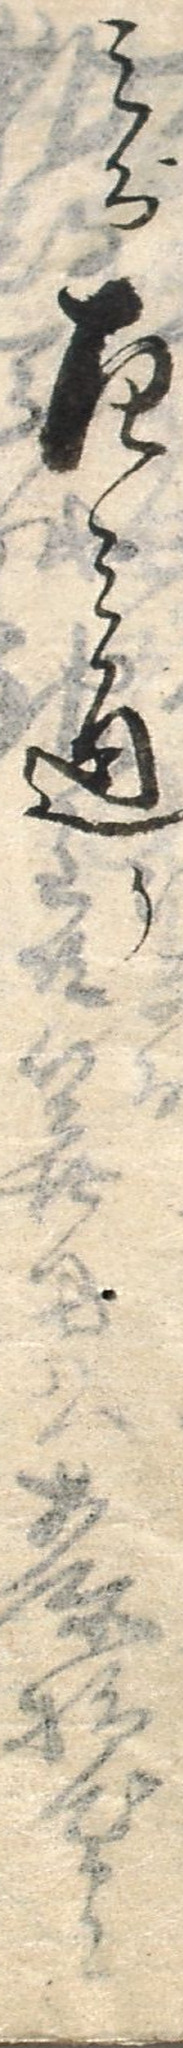之分左之通り
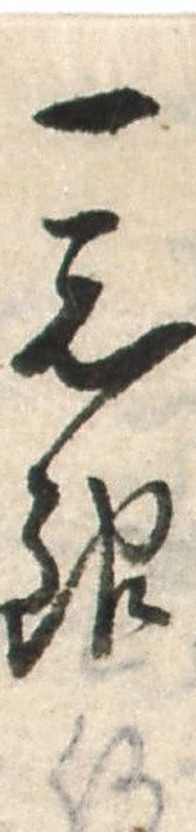一元銀
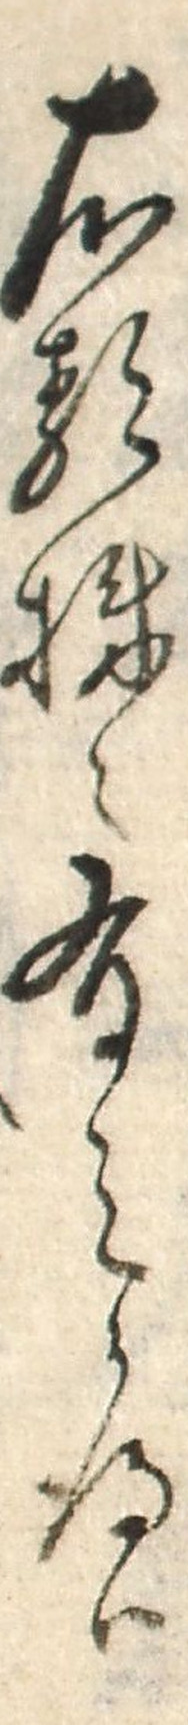右類株々有之候得は
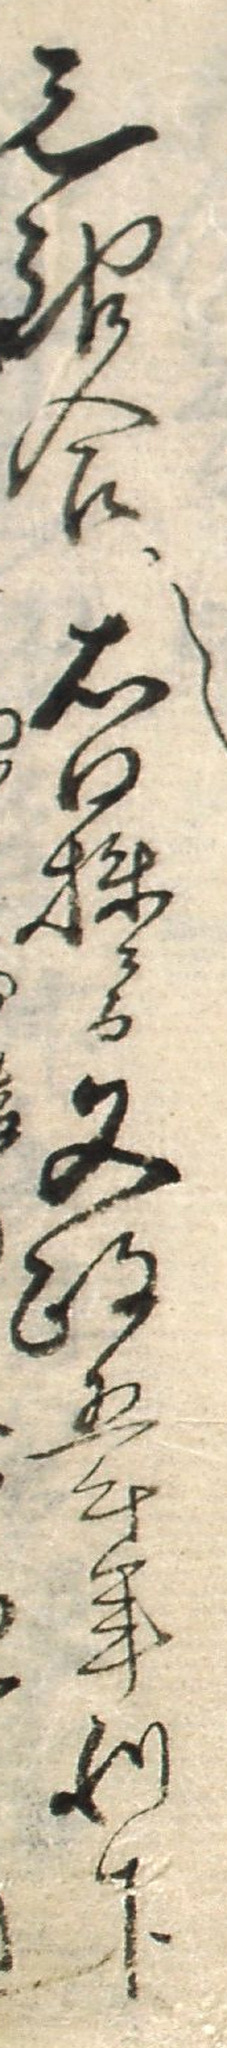元銀合右同株に而文政五午年利下
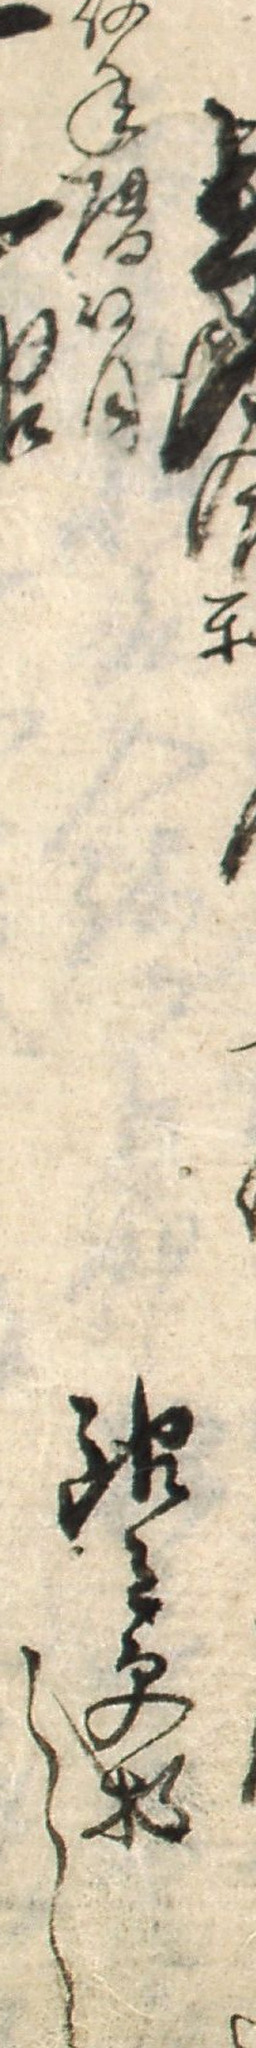何年暦何月銀主受持
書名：御家中并無格御奉公人借銀御仕解一件御書付写其余共控
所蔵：鳴門教育大学 Naruto University of Education
